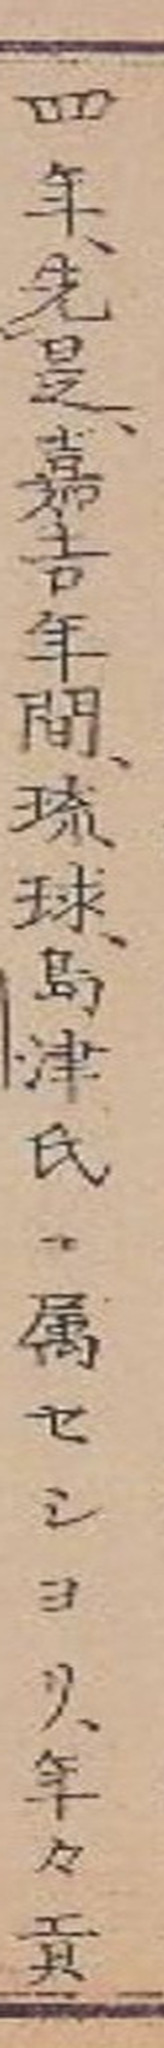四年、先是、嘉吉年間、琉球、島津氏ニ属セシヨリ、年々貢
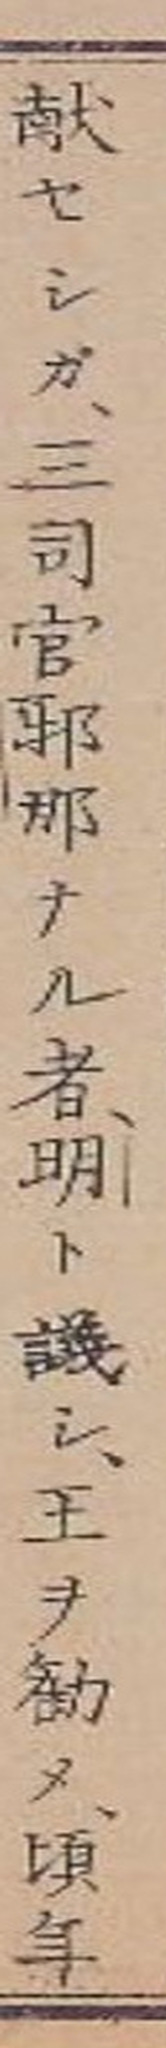献セシガ、三司官邪那ナル者、明ト議シ、王ヲ勧メ、頃年
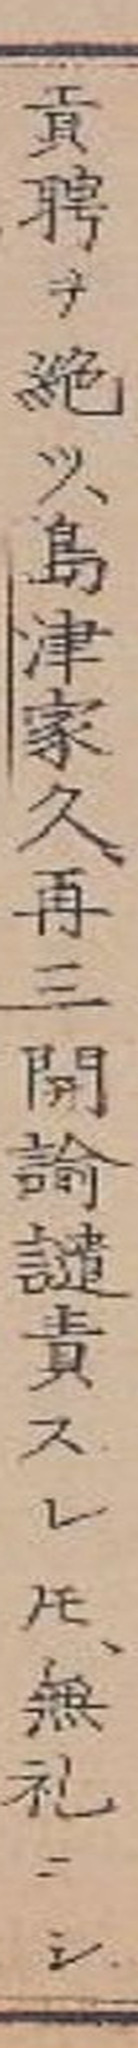貢聘ヲ絶ツ、島津家久、再三開諭譴責スレトモ、無礼ニシ
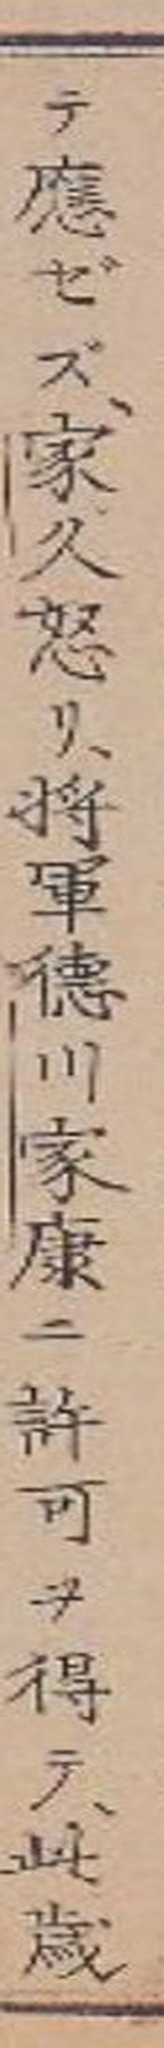テ応ゼズ、家久怒リ、将軍徳川家康ニ許可ヲ得テ、此歳
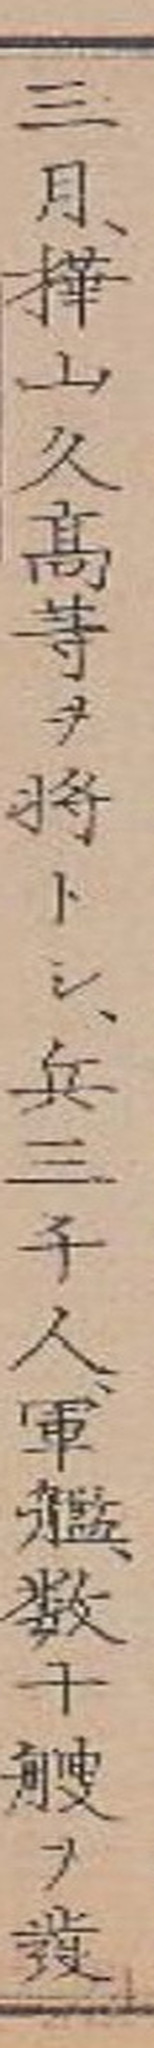三月、樺山久高等ヲ将トシ、兵三千人、軍艦、数十艘ヲ発
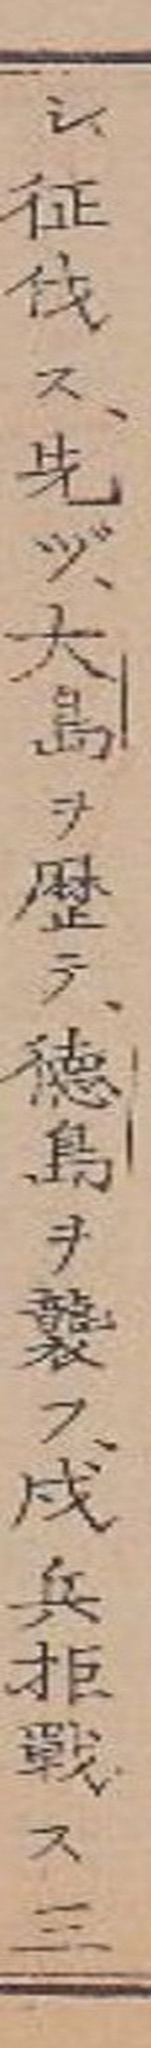シ征伐ス、先ヅ、大島ヲ歴テ、徳島ヲ襲フ、戍兵拒戦ス三
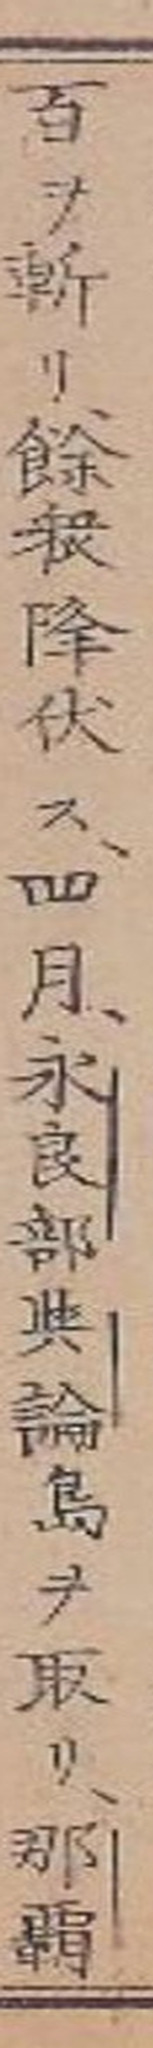百ヲ斬リ、余衆降伏ス、四月、永良部与論島ヲ取リ、那覇
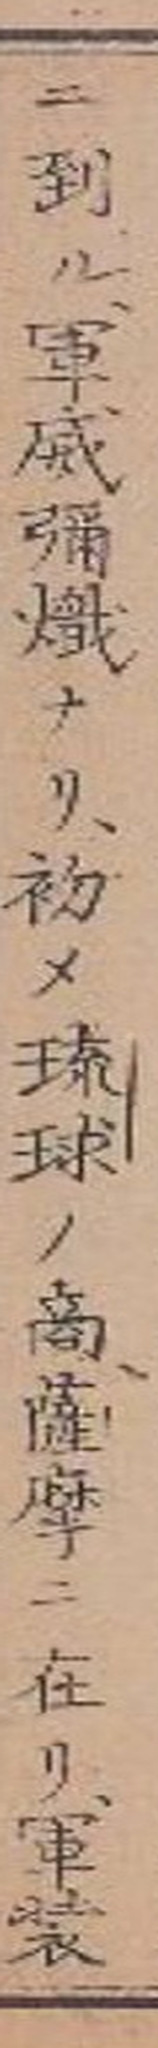ニ到ル、軍威弥熾ナリ、初メ琉球ノ商、薩摩ニ在リ、軍装

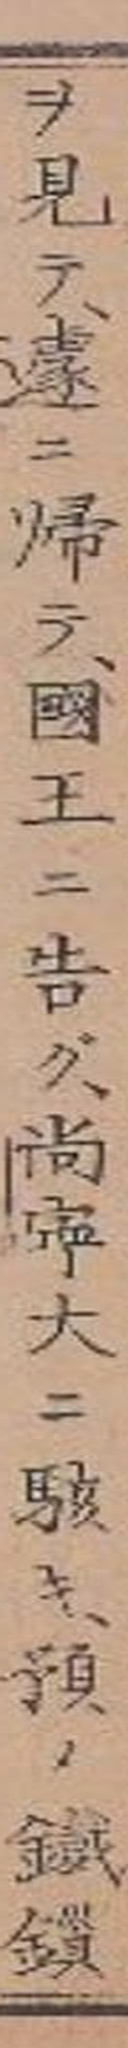ヲ見テ、遽ニ帰テ、国王ニ告グ、尚寧大ニ駭キ、預メ鉄鎖
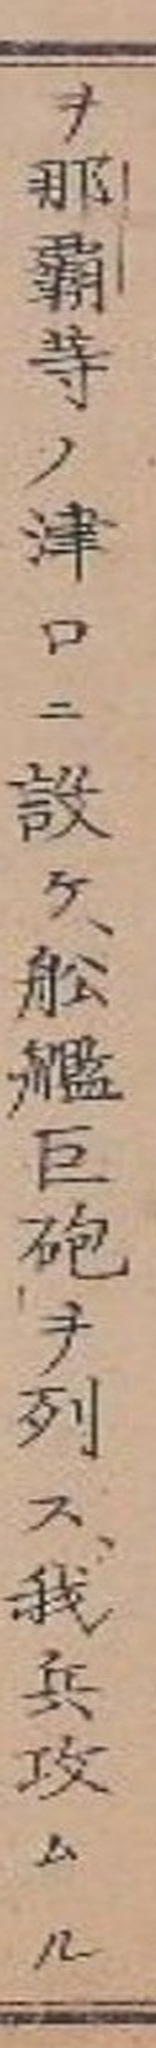ヲ那覇等ノ津口ニ設ケ、船艦巨砲ヲ列ス、我兵攻ムル
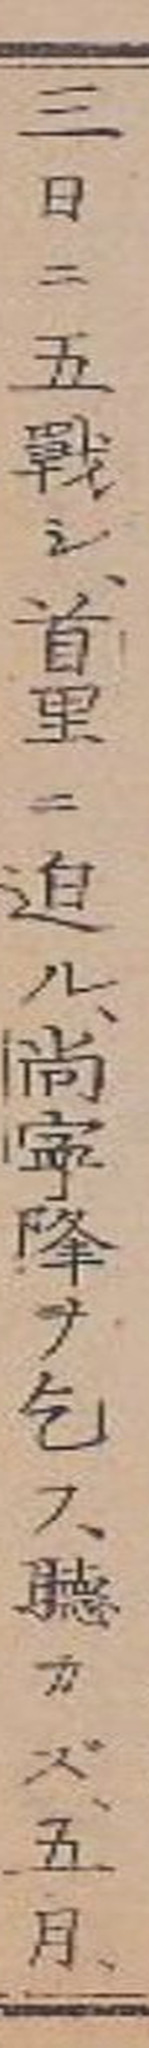三日ニ五戦シ、首里ニ迫ル、尚寧降ヲ乞フ、聴カズ、五月、
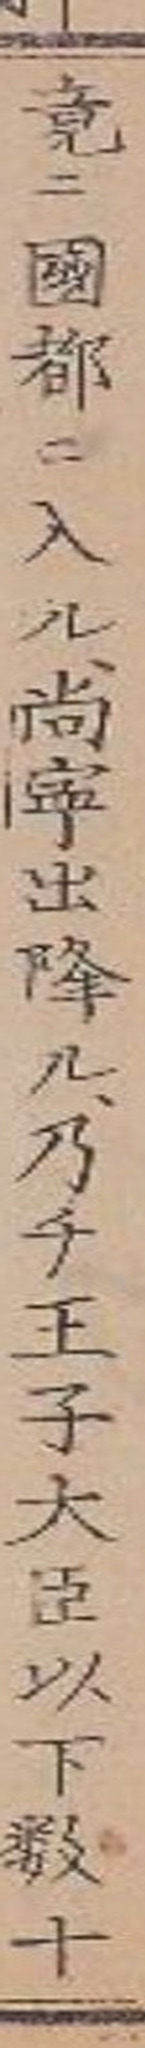竟ニ国都ニ入ル、尚寧出降ル、乃チ王子大臣以下数十
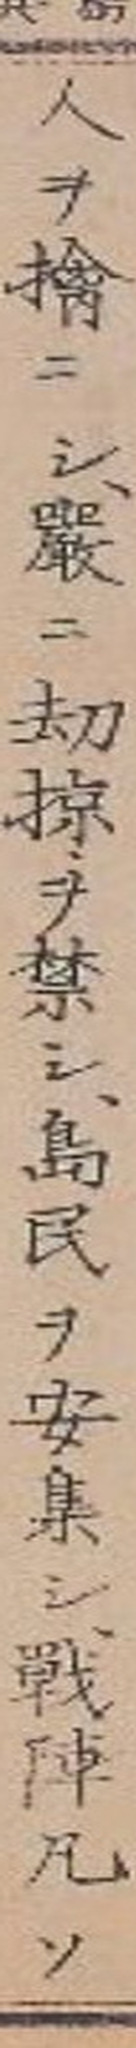人ヲ擒ニシ、厳ニ劫掠ヲ禁シ、島民ヲ安集シ、戦陣凡ソ
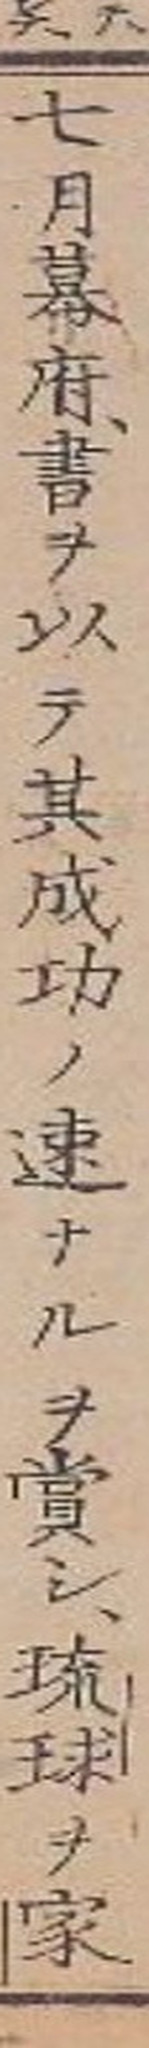七月幕府、書ヲ以テ其成功ノ速ナルヲ賞シ、琉球ヲ家
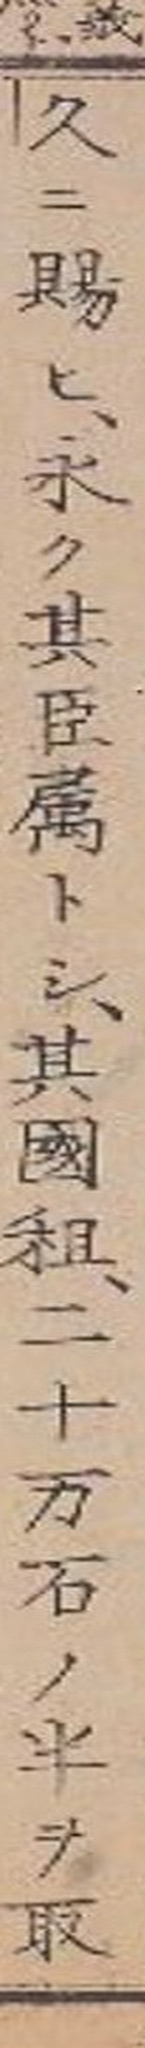久ニ賜ヒ、永ク其臣属トシ、其国租、二十万石ノ半ヲ取
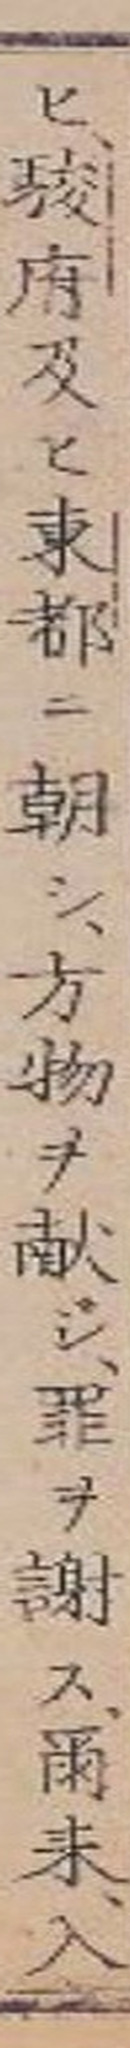ヒ、駿府及ヒ東都ニ朝シ、方物ヲ献ジ、罪ヲ謝ス、爾来、入
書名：琉球新誌 巻上
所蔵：University of the Ryukyus Library
